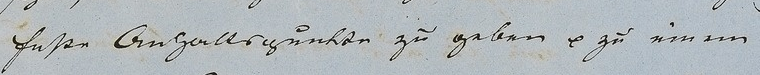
feste Anhaltspunkte zu geben & zu einem
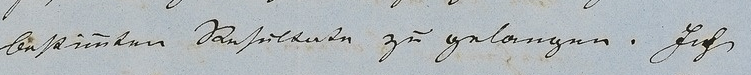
bestimmten Resultate zu gelangen. Ich
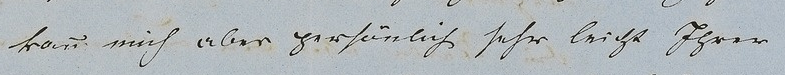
kann mich aber persönlich sehr leicht Ihrer
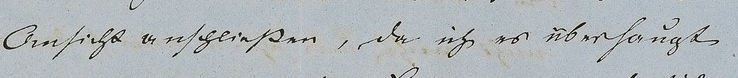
Ansicht anschließen, da ich es überhaupt
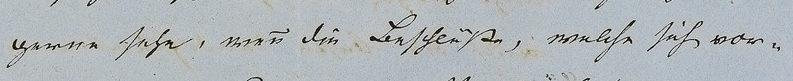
gerne sehe, wenn die Beschlüße, welche sich vor-
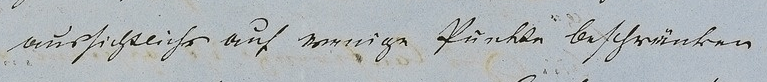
aussichtlich auf wenige Punkte beschränken
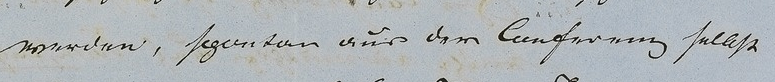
werden, spontan aus der Conferenz selbst
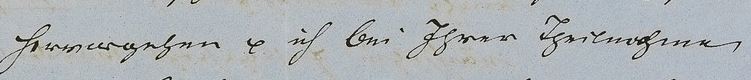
hervorgehen & ich bei Ihrer Theilnahme
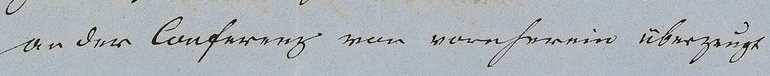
an der Conferenz von vornherein überzeugt
